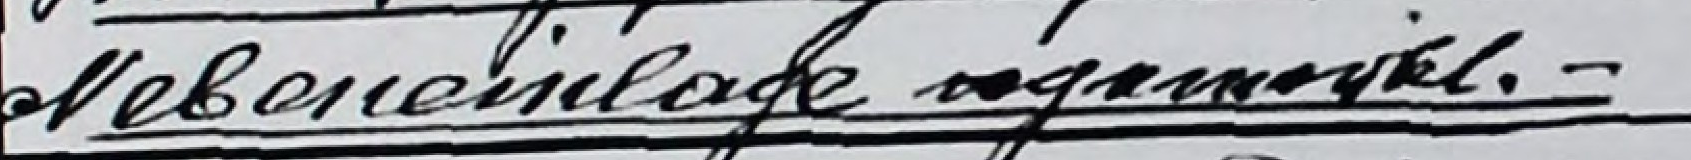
Nebeneinlage angemerkt.-
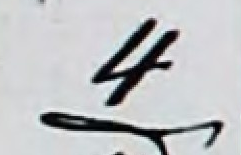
4
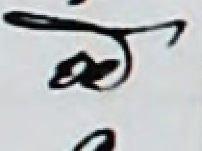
a
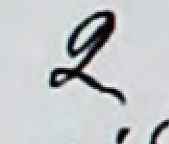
2
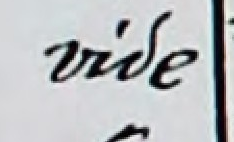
vide
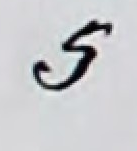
5
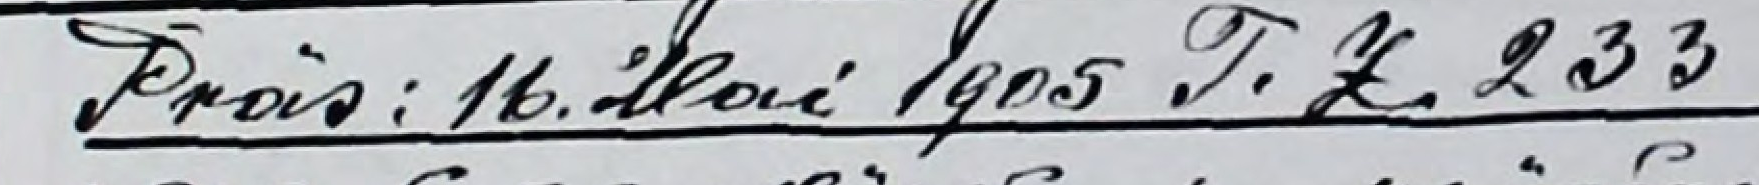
Präs: 16. Mai 1905 T.Z. 233
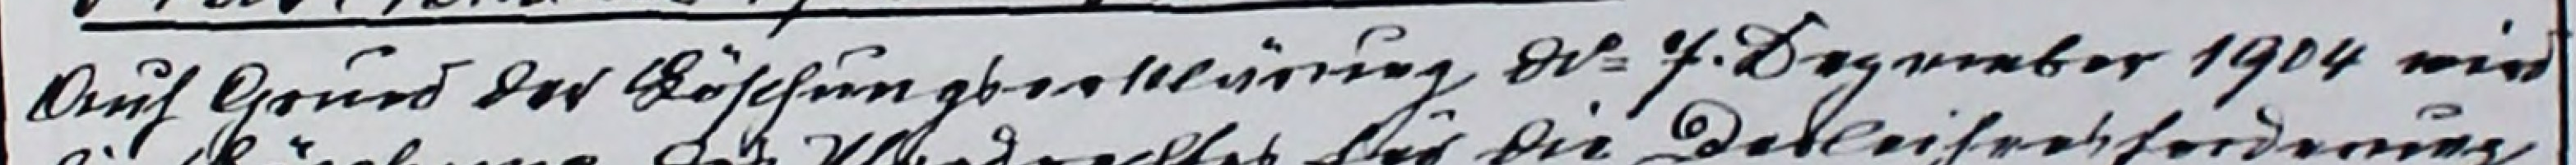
Auf Grund der Löschungserklärung ddo 7. Dezember 1904 wird
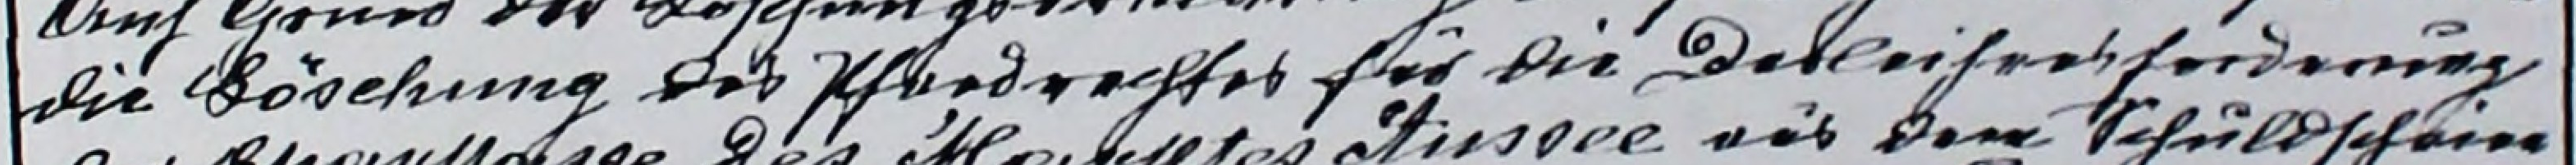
die Löschung des Pfandrechtes für die Darleihensforderung
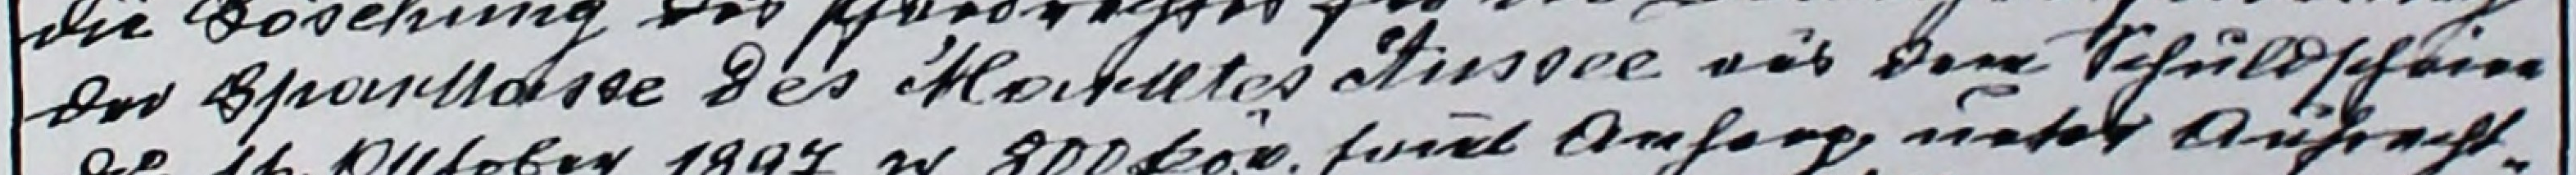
der Sparkasse des Marktes Aussee aus dem Schuldscheine
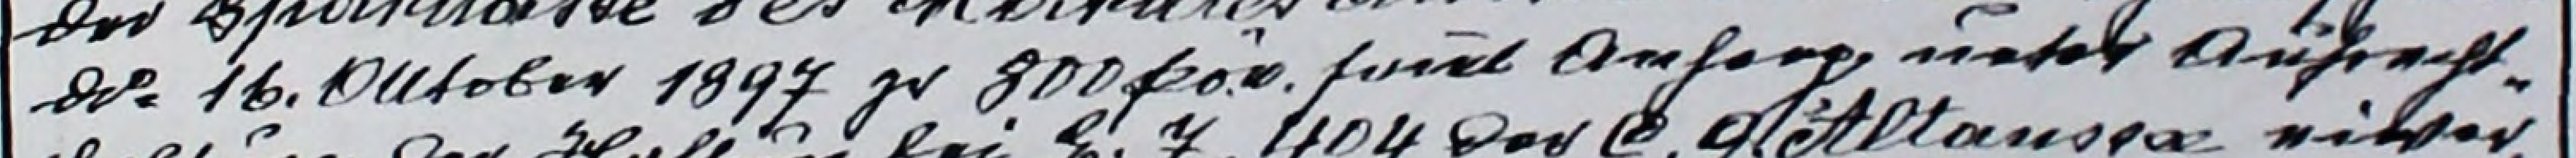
ddo 16. Oktober 1897 pr 800 f ö.k. sammt Anhang, unter Aufrecht„
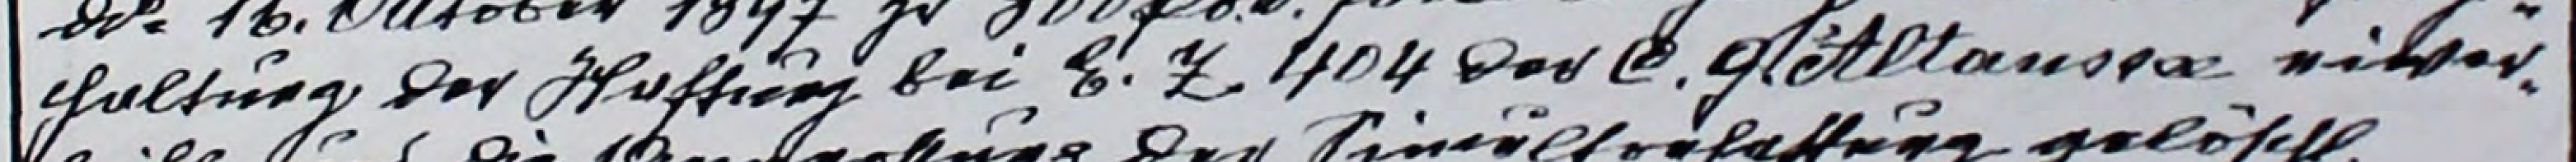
haltung der Haftung bei E.Z. 404 der C.G. Altaussee einver„
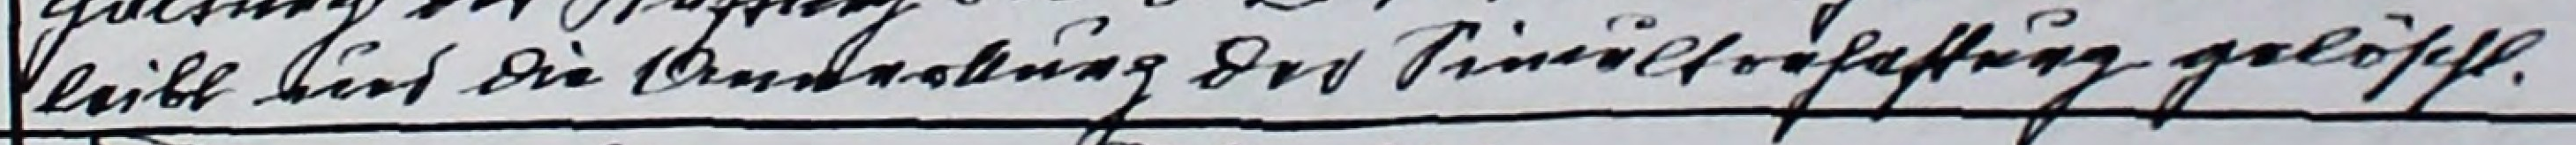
leibt und die Anmerkung der Simultanhaftung gelöscht.
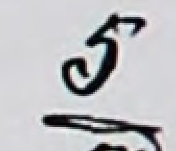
5
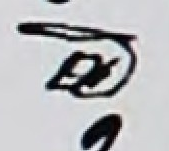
a
